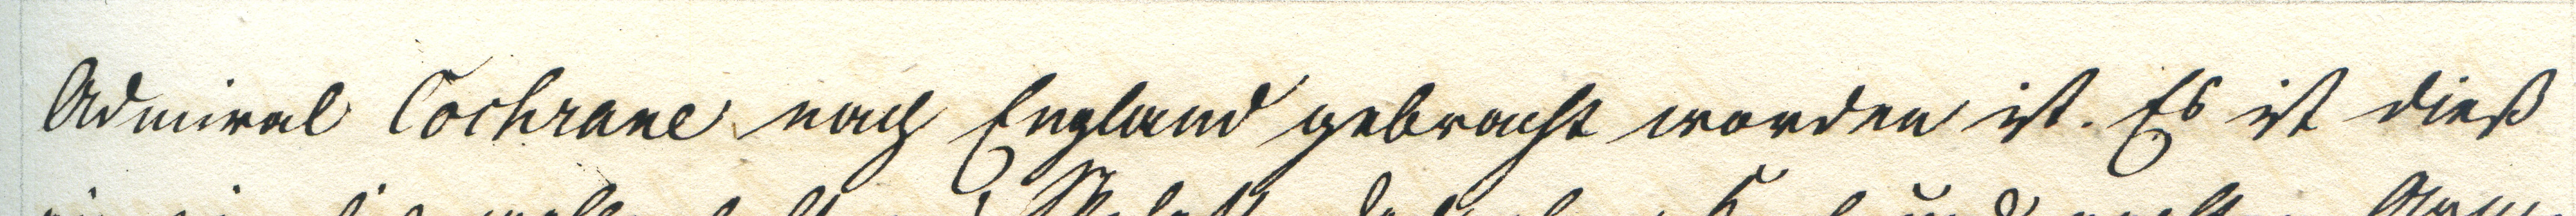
Admiral Cochrane nach England gebracht worden ist. Es ist dieß
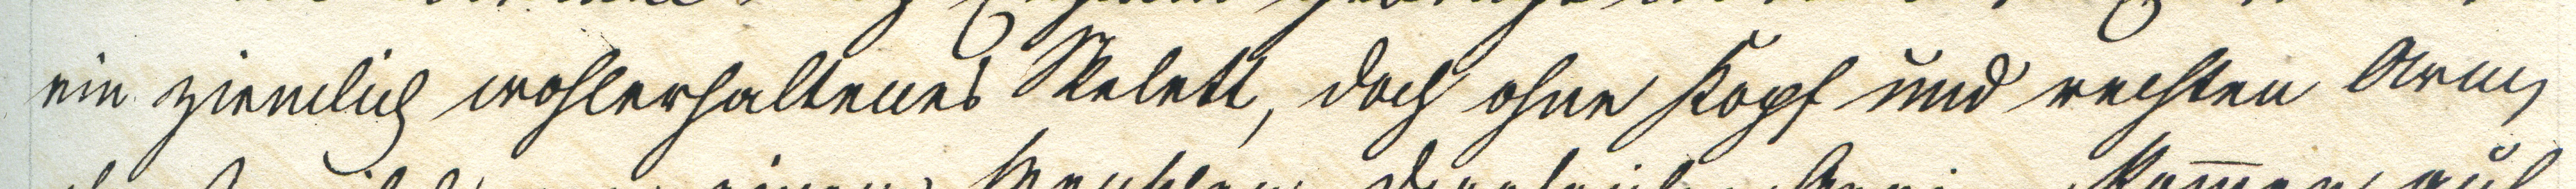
ein ziemlich wohlerhaltenes Skelett, doch ohne Kopf und rechten Arm,
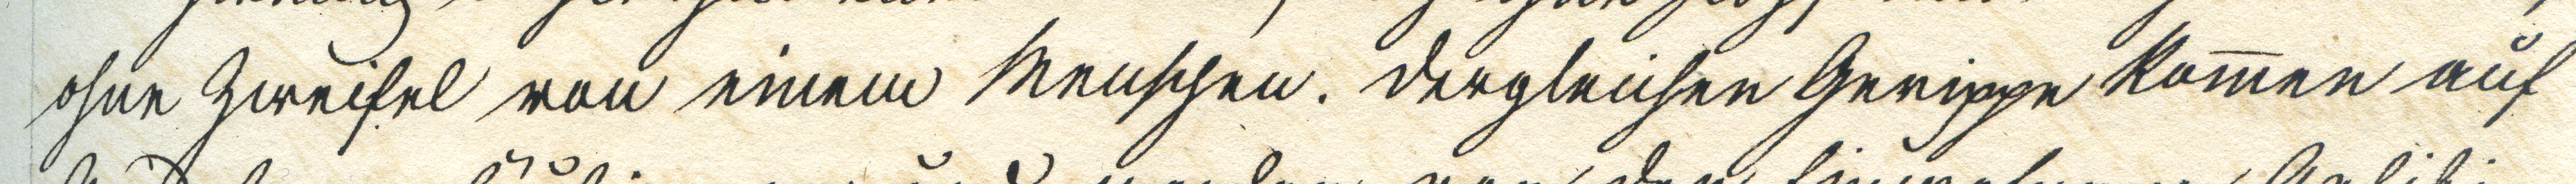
ohne Zweifel von einem Menschen. Dergleichen Gerippe kom̃en auf
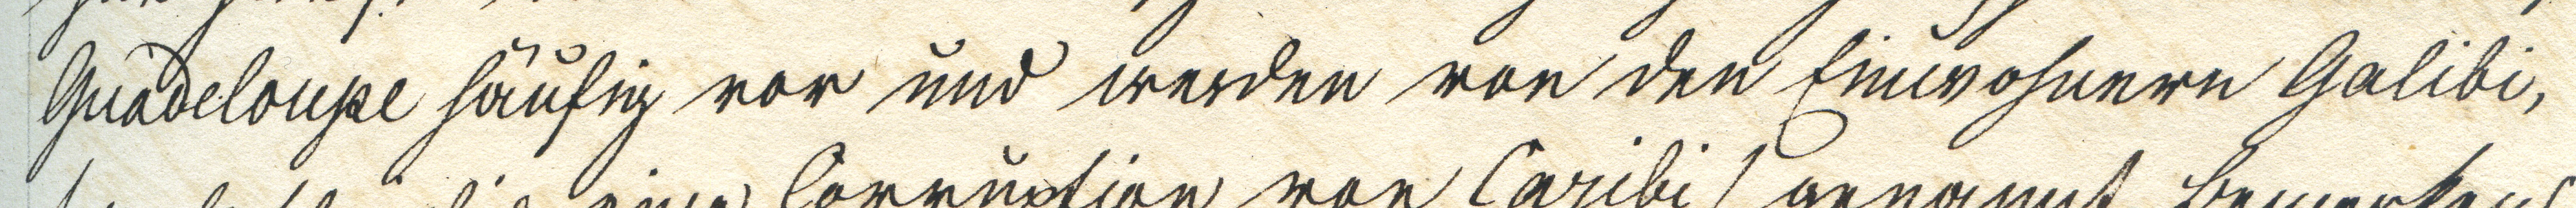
Guadeloupe häufig vor und werden von den Einwohnern Galibi,
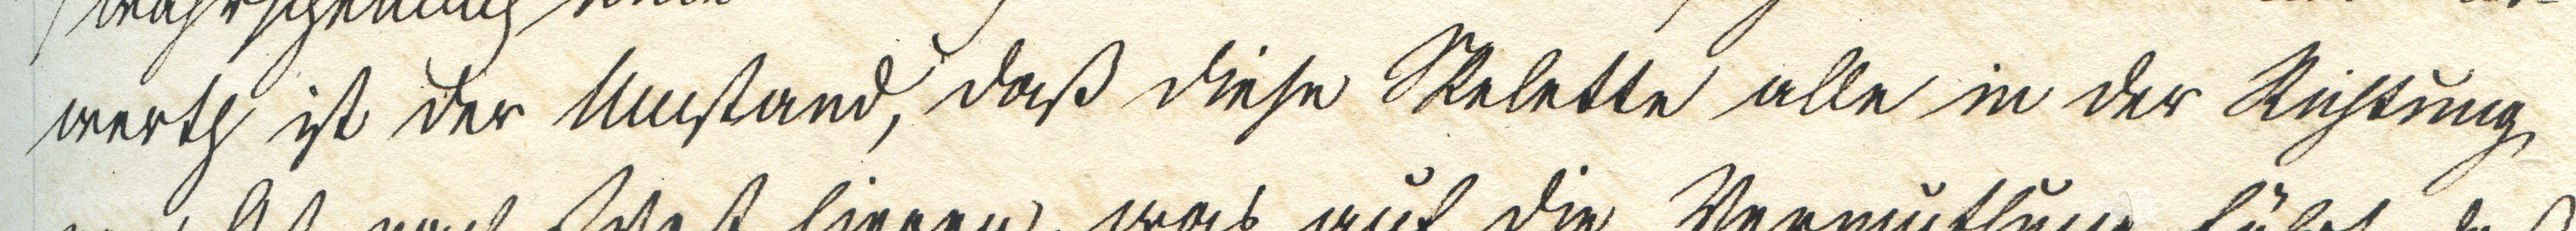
werth ist der Umstand, daß diese Skelette alle in der Richtung
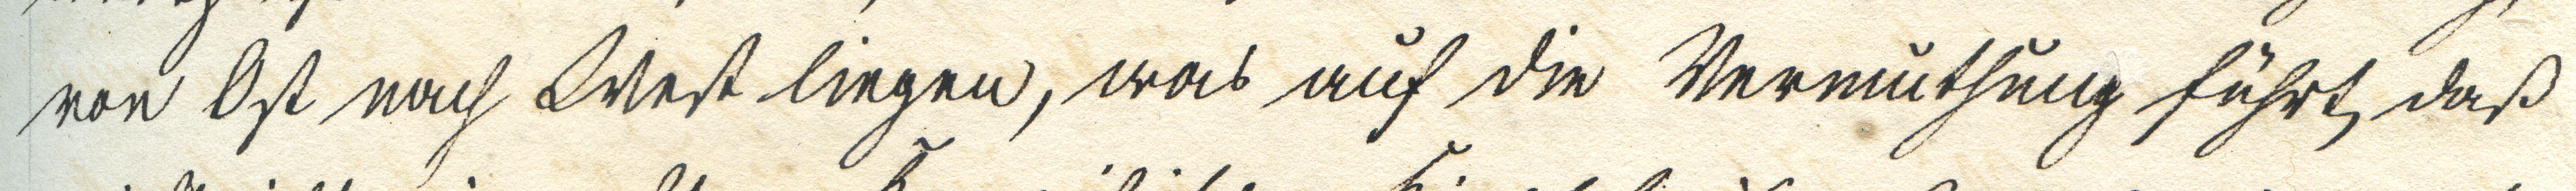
von Ost nach West liegen, was auf die Vermuthung führt, daß
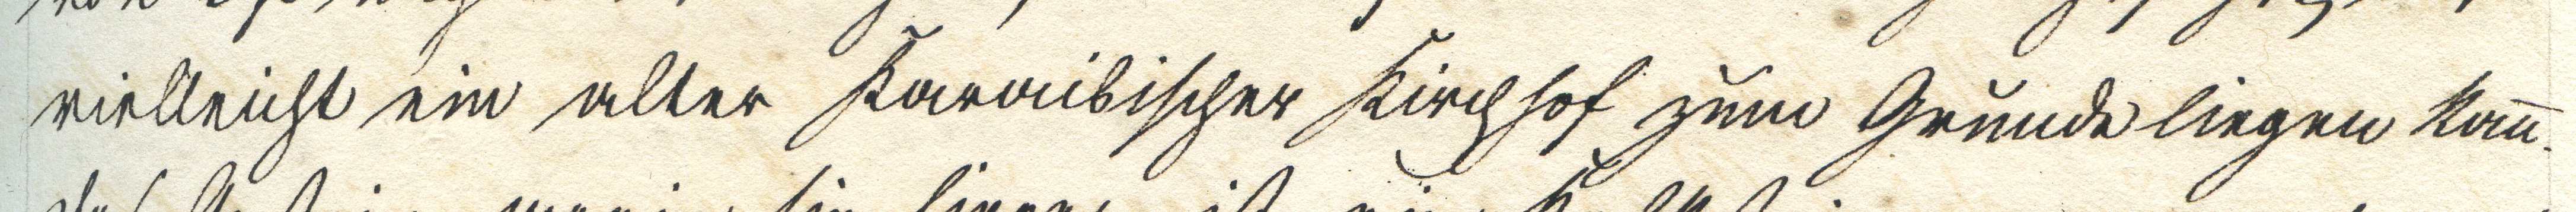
vielleicht ein alter Karaibischer Kirchhof zum Grunde liegen kañ.
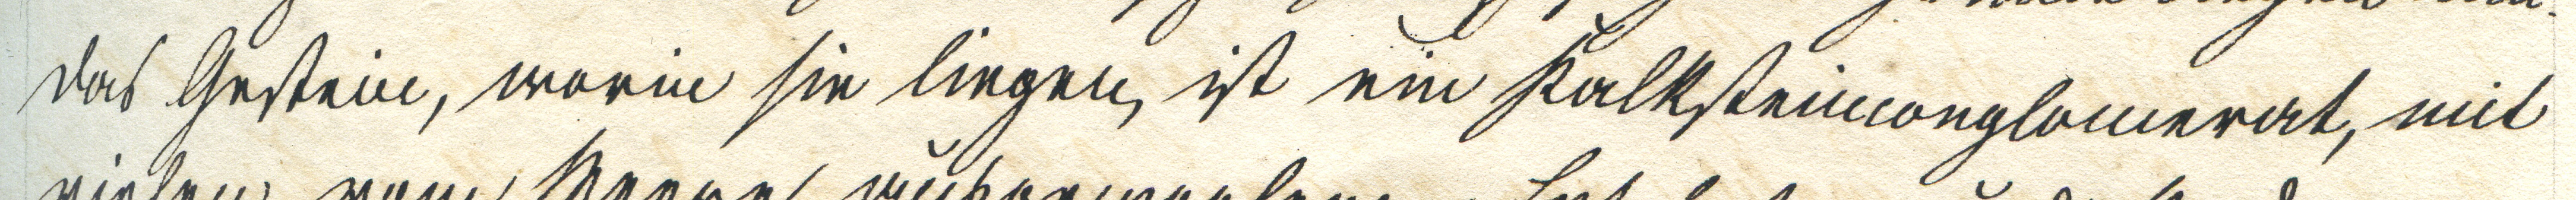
Das Gestein, worin sie liegen, ist ein Kalksteinconglomerat, mit
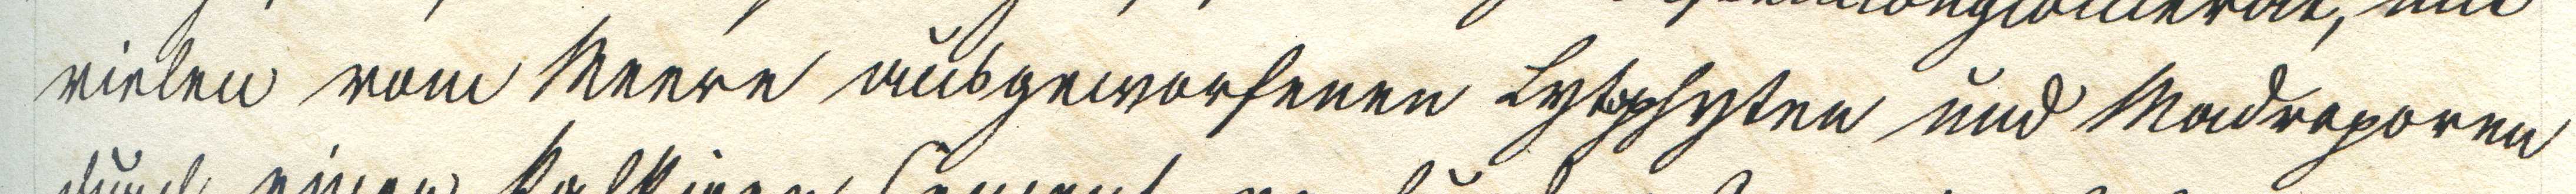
vielen vom Meere ausgeworfenen Lytophyten und Madreporen
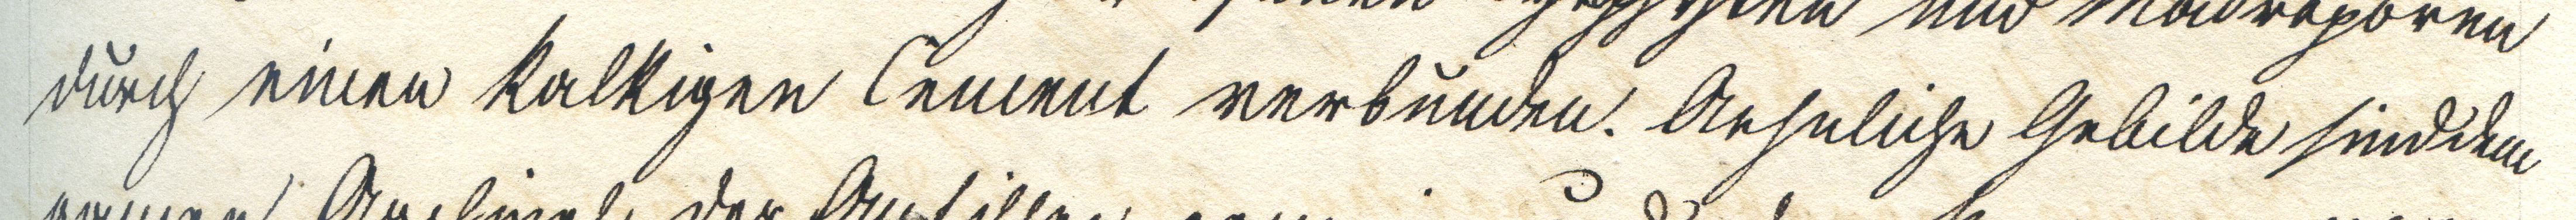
durch einen kalkigen Cement verbunden. Aehnliche Gebilde sind dem
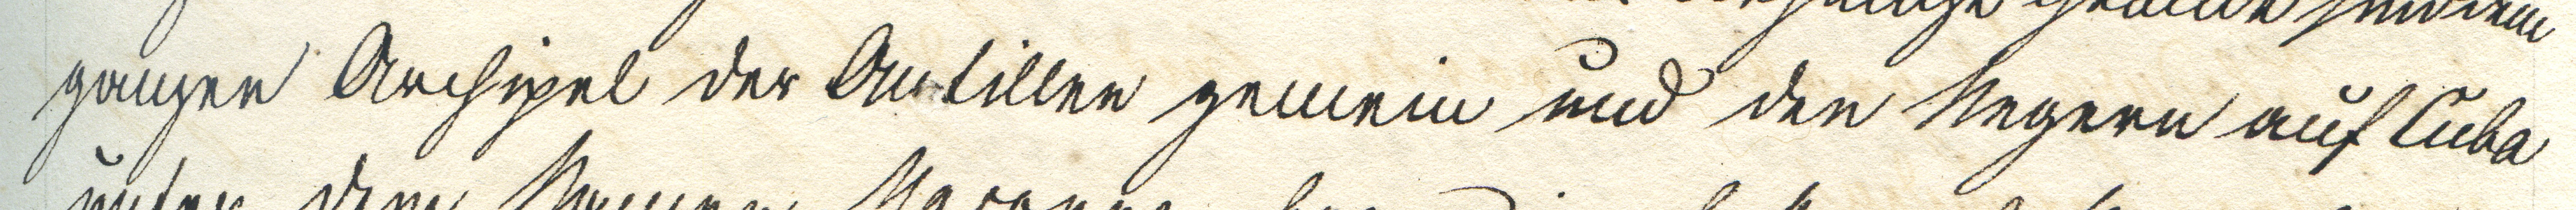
ganzen Archipel der Antillen gemein und den Negern auf Cuba
